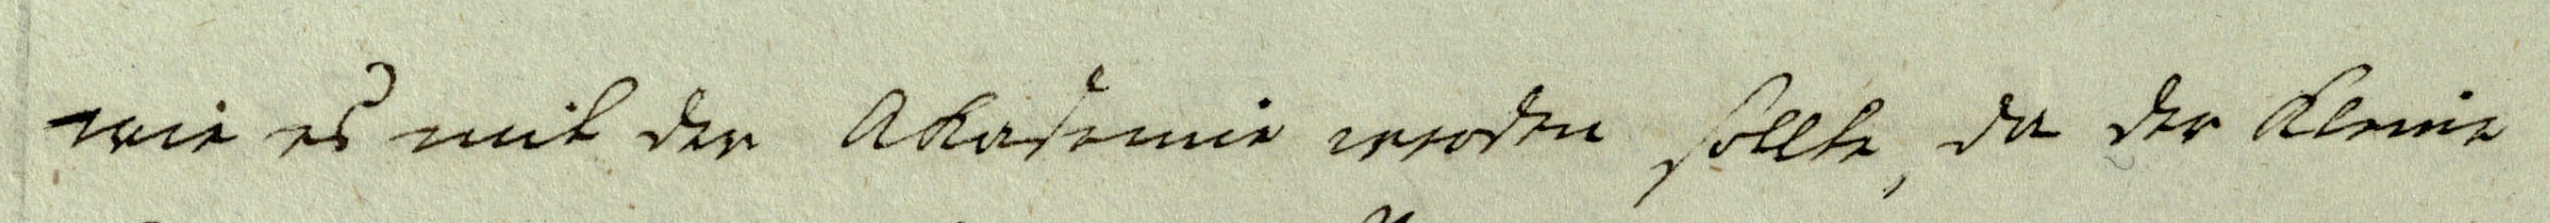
wie es mit der Akademie werden sollte da der kleine
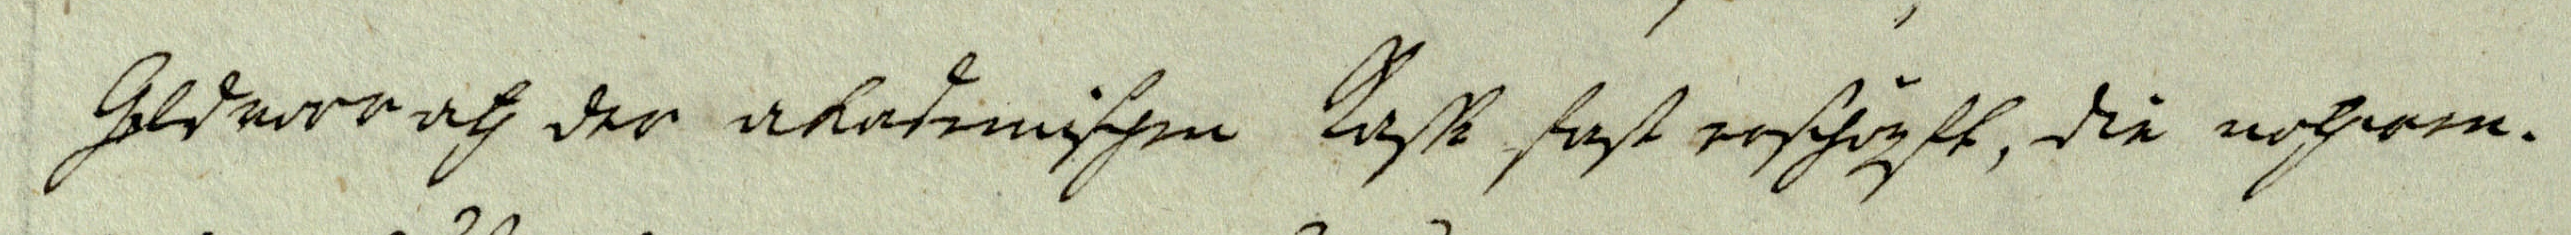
Geldvorrath der akademischen Kasse fast erschöpft, die nothwen¬
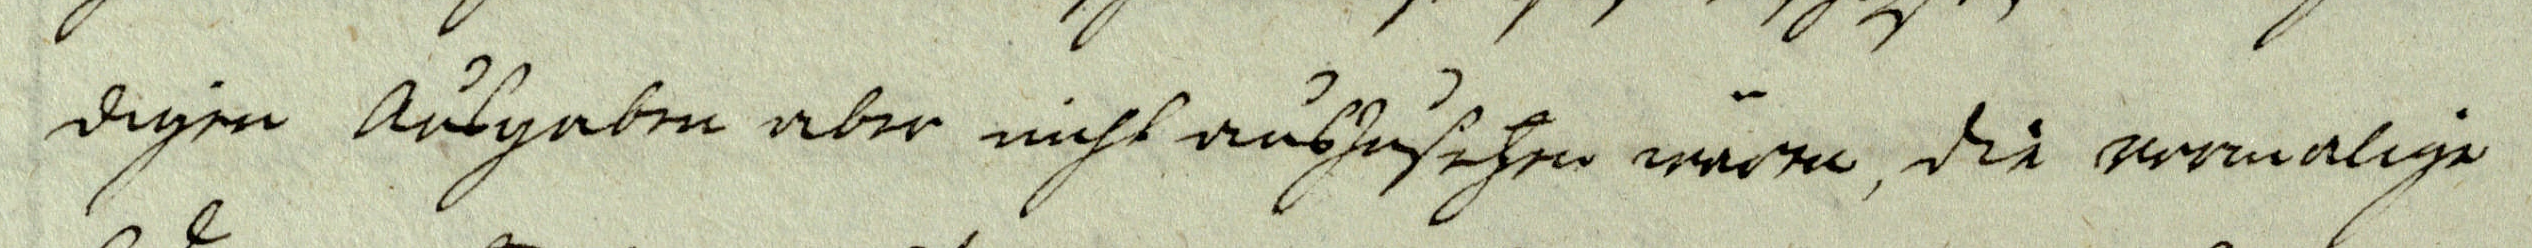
digen Ausgaben aber nicht auszusetzen wären, die vormalige
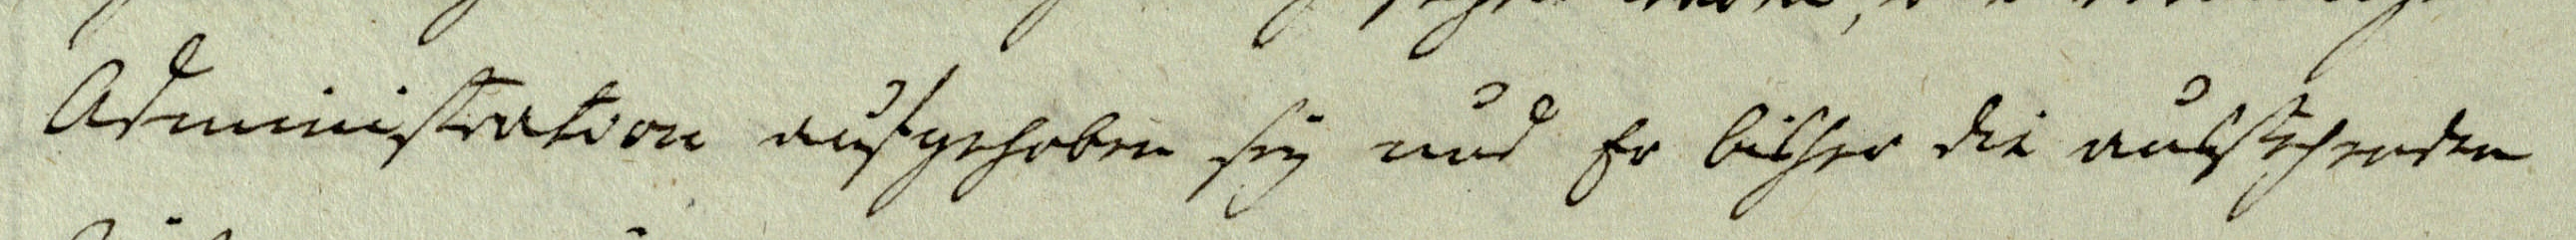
Administration aufgehoben seÿ und Er bisher die ausstehenden
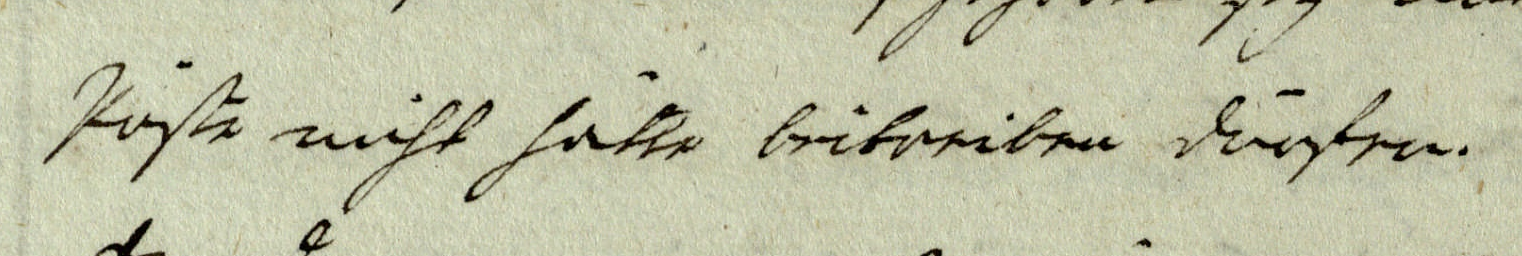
Pöste nicht hätte beitreiben dürfen.
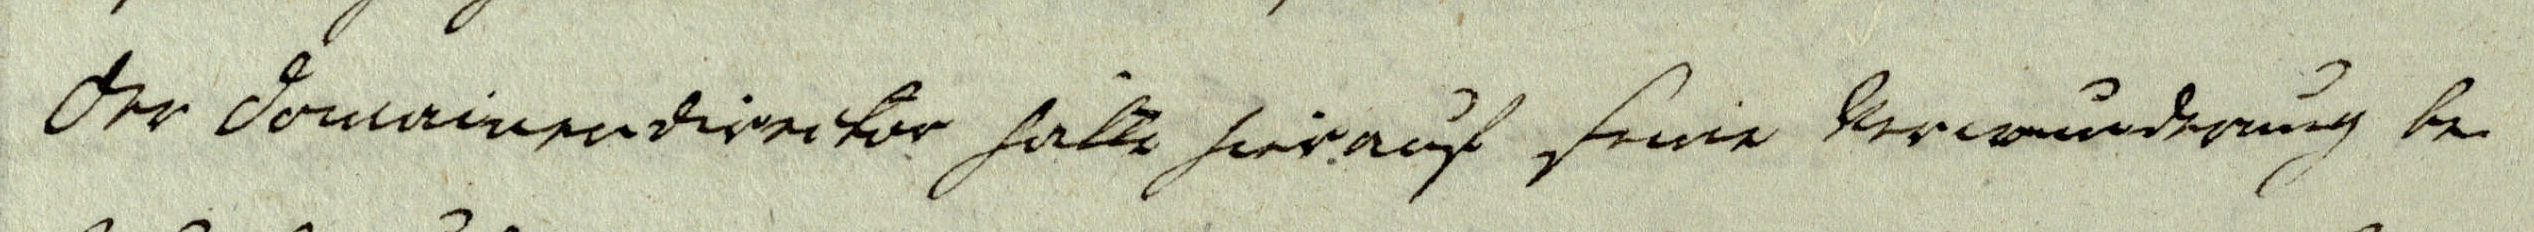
Der Domainendirector hätte hierauf seine Verwunderung be¬
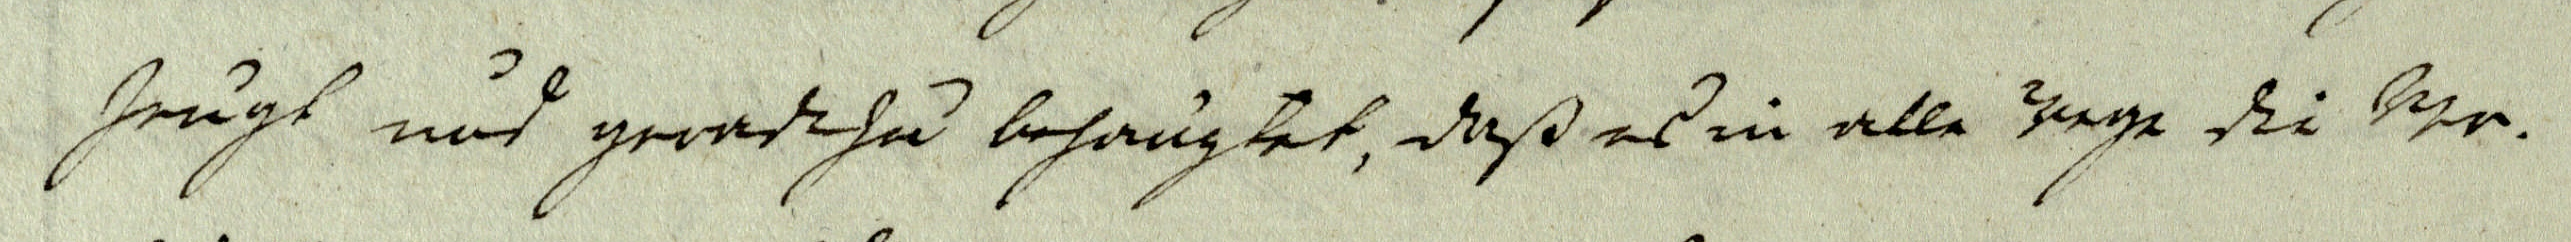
zeugt und geradezu behauptet, daß es in alle Wege die Ver¬
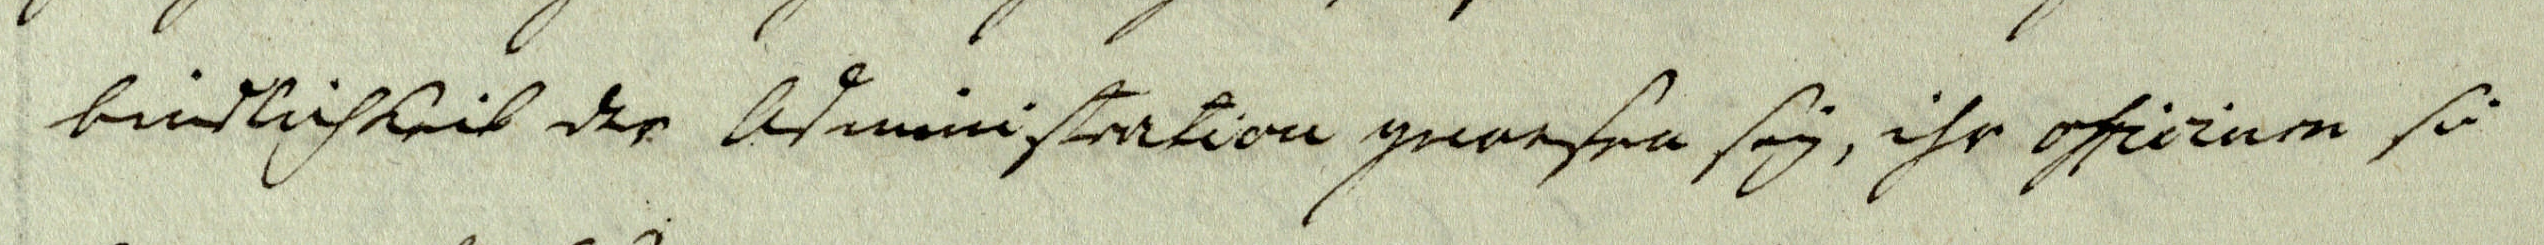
bindlichkeit der Administration gewesen seÿ, ihr officium so
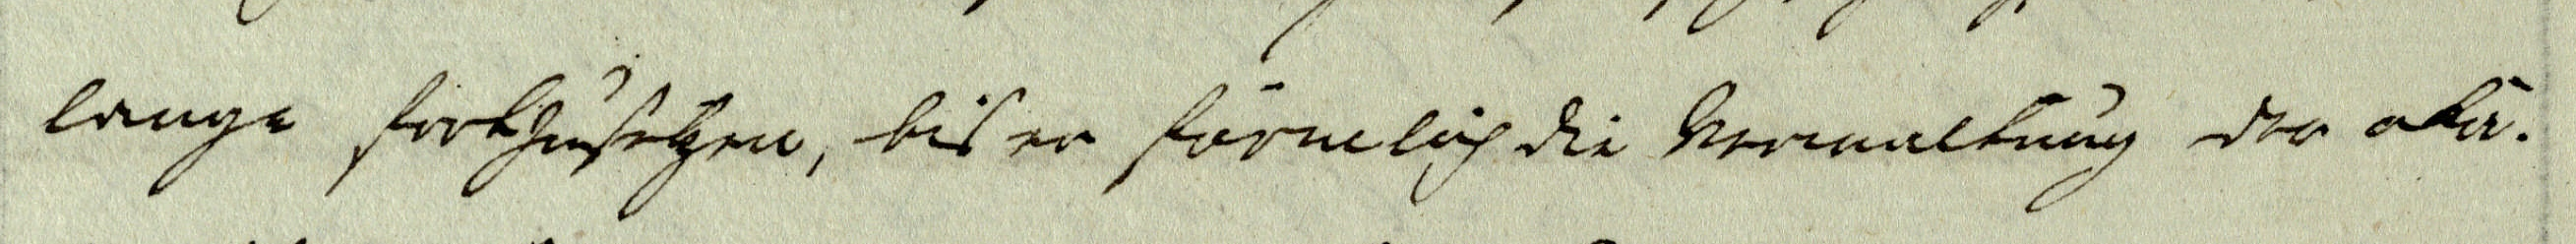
lange fortzusetzen, bis er förmlich die Verwaltung der aka¬
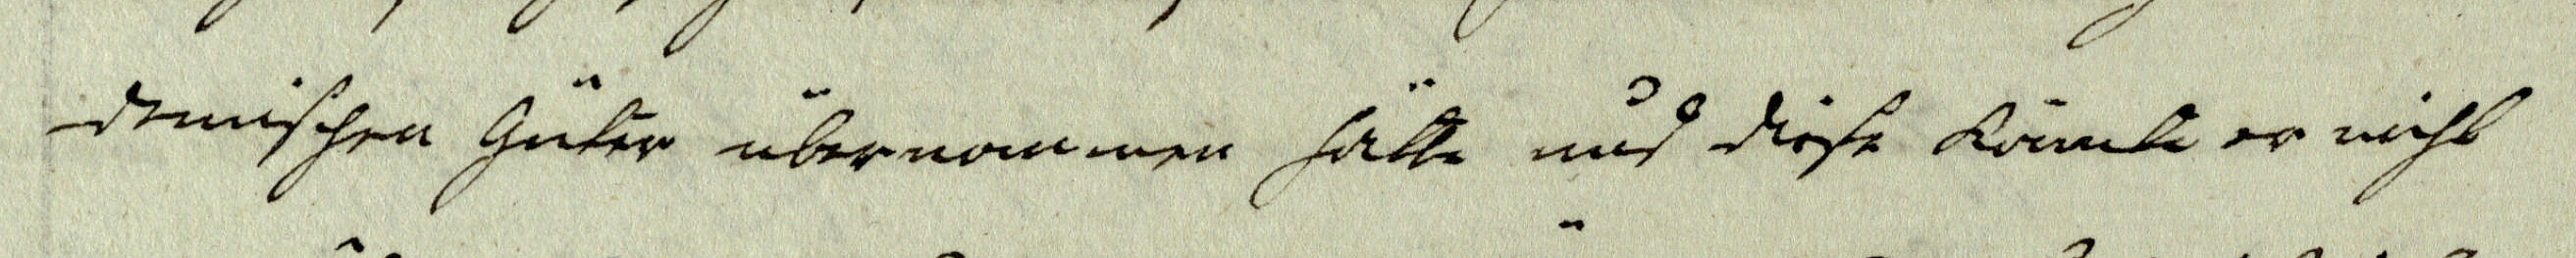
demischen Güter übernommen hätte und diese könnte er nicht
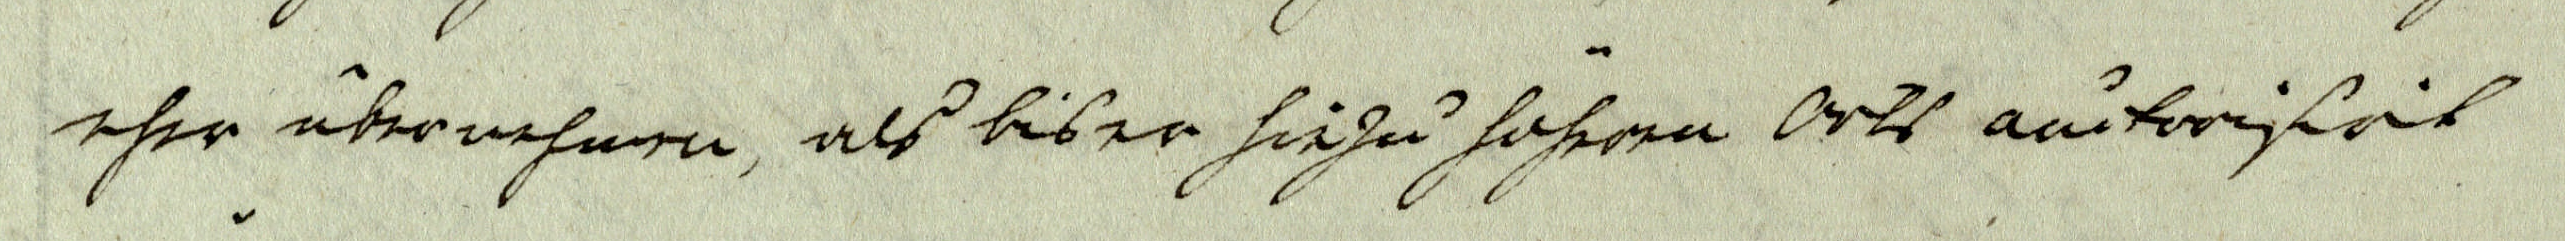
eher übernehmen, als bis er hiezu höheren Orts auctorisirt
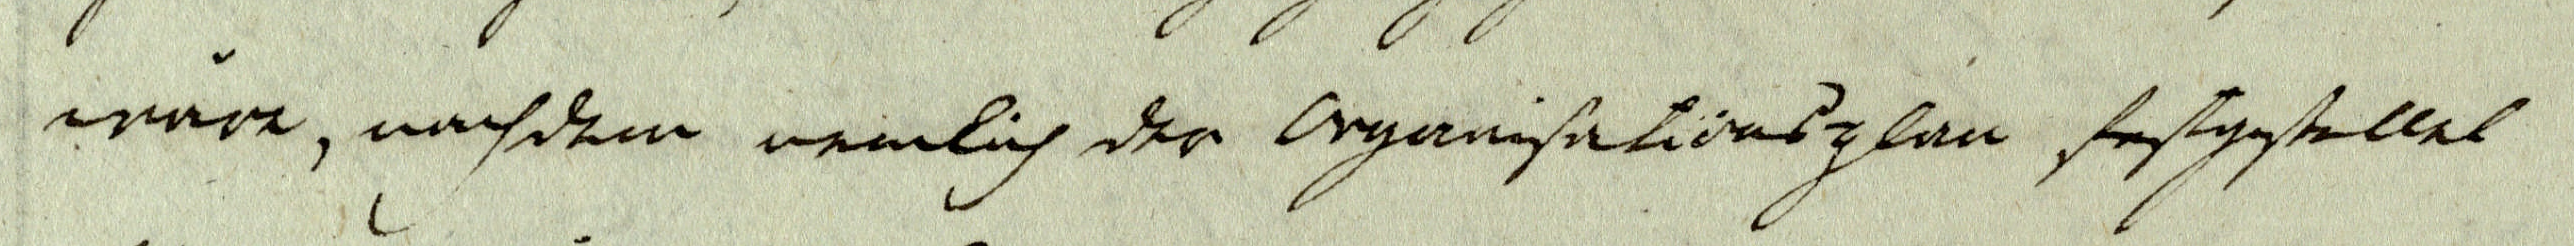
wäre, nachdem nemlich der Organisationsplan festgestellet
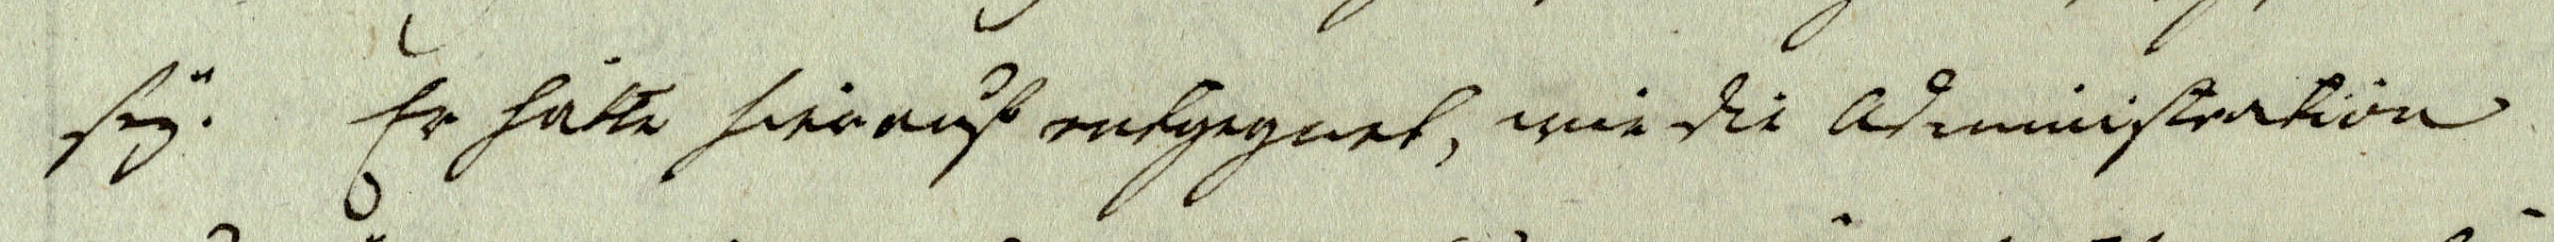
seÿ. Er hätte hierauf entgegnet, wie die Administration
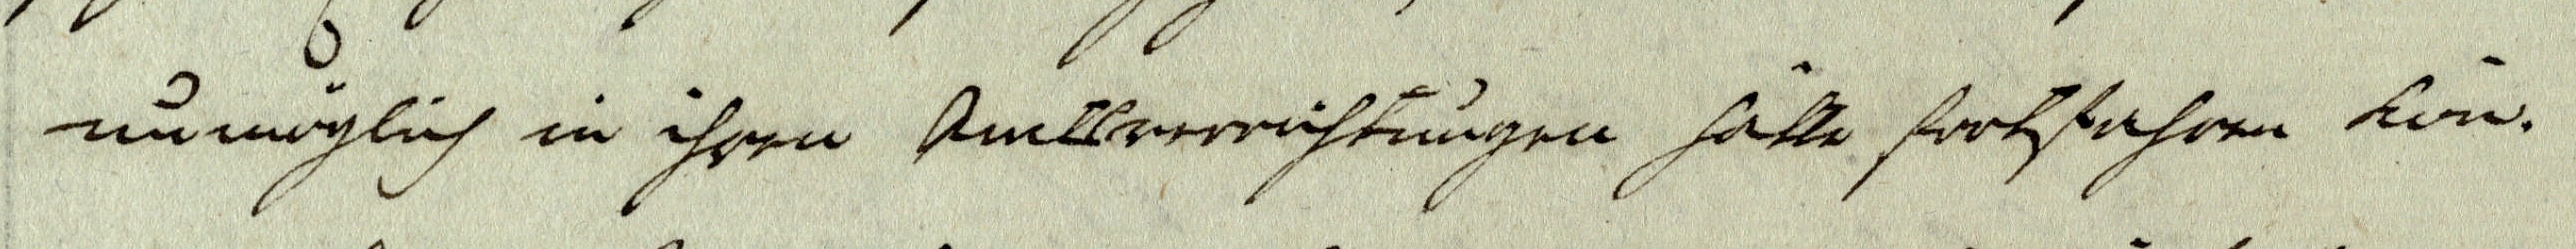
unmöglich in ihren Amtsverrichtungen hätte fortfahren kön¬
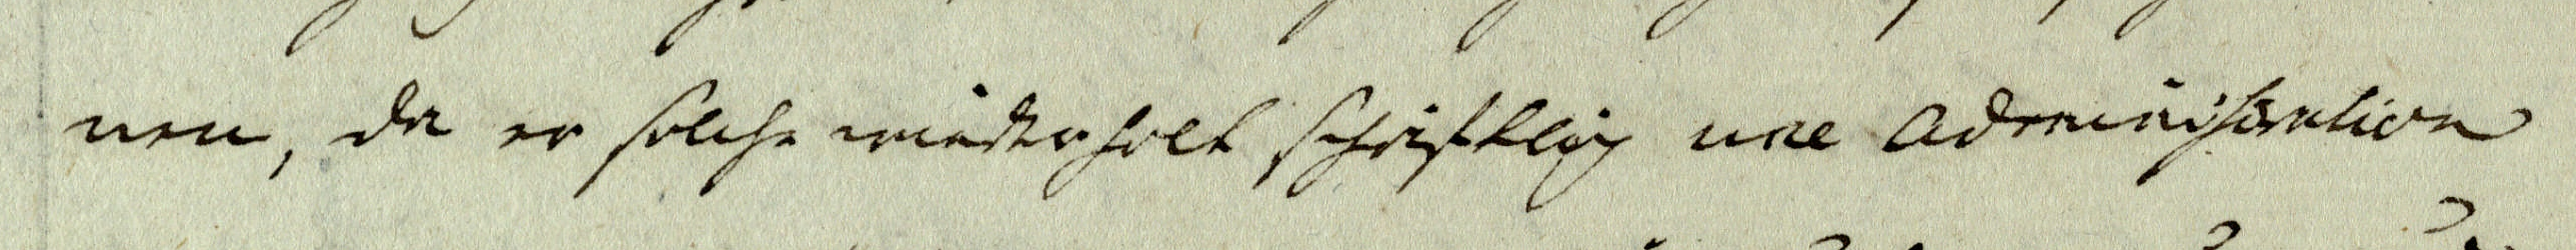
nen, da er solche wiederholt schriftlich une Administration
